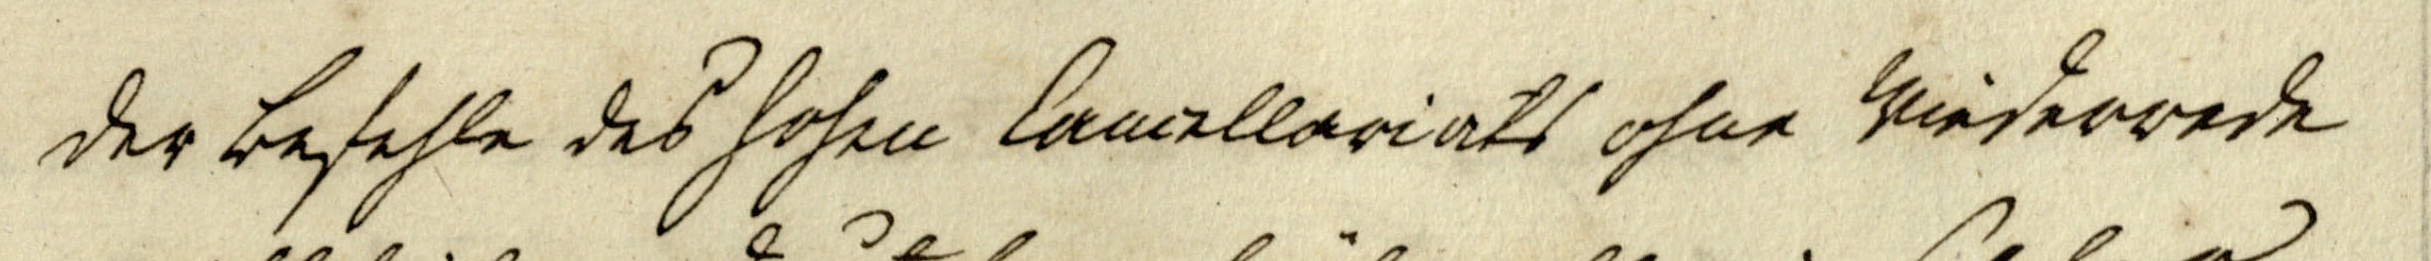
der Befehle des hohen Cancellariats ohne Wiederrede
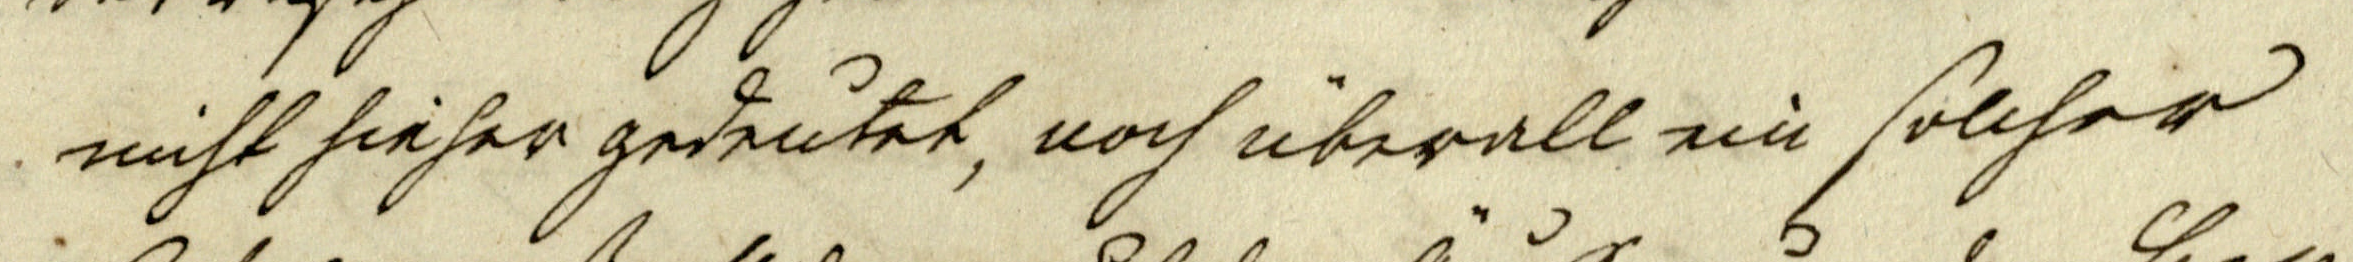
nicht hieher gedeutet, noch überall ein solcher
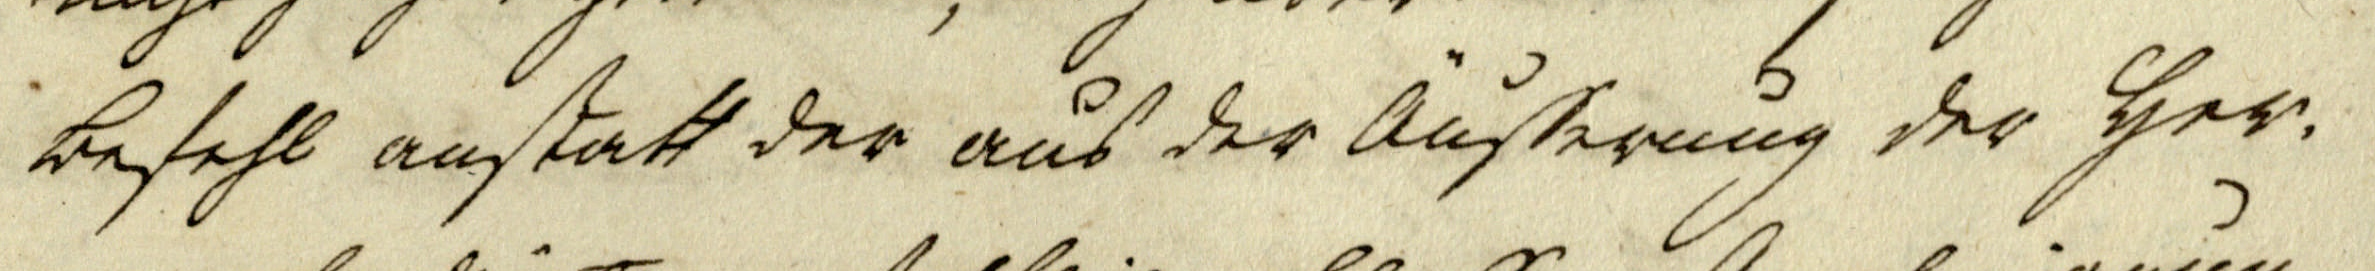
Befehl anstatt der aus der Äusserung der Her¬
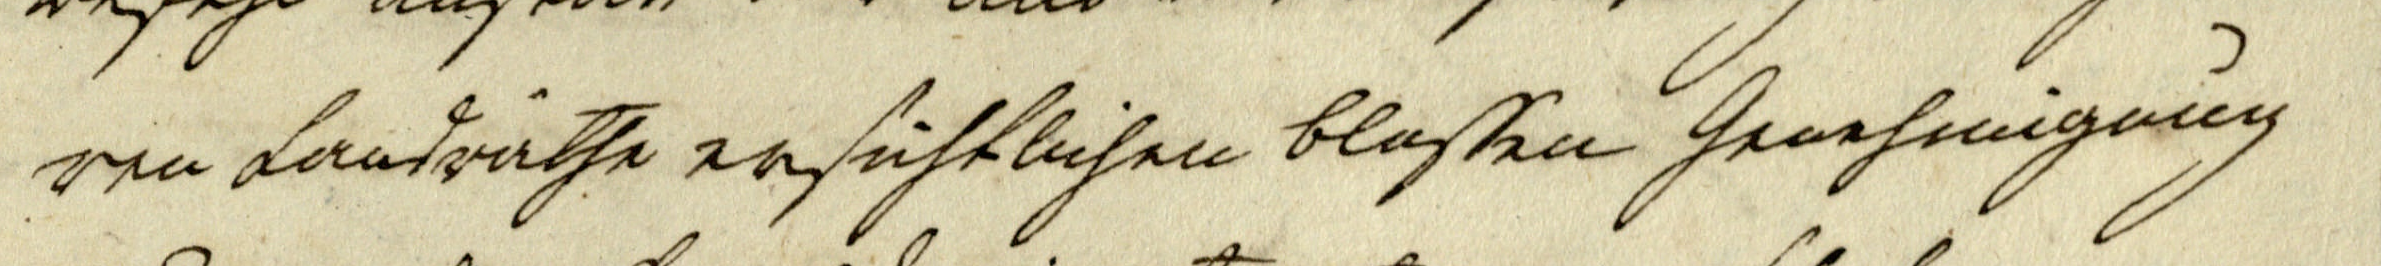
ren Landräthe ersichtlichen blossen Genehmigung
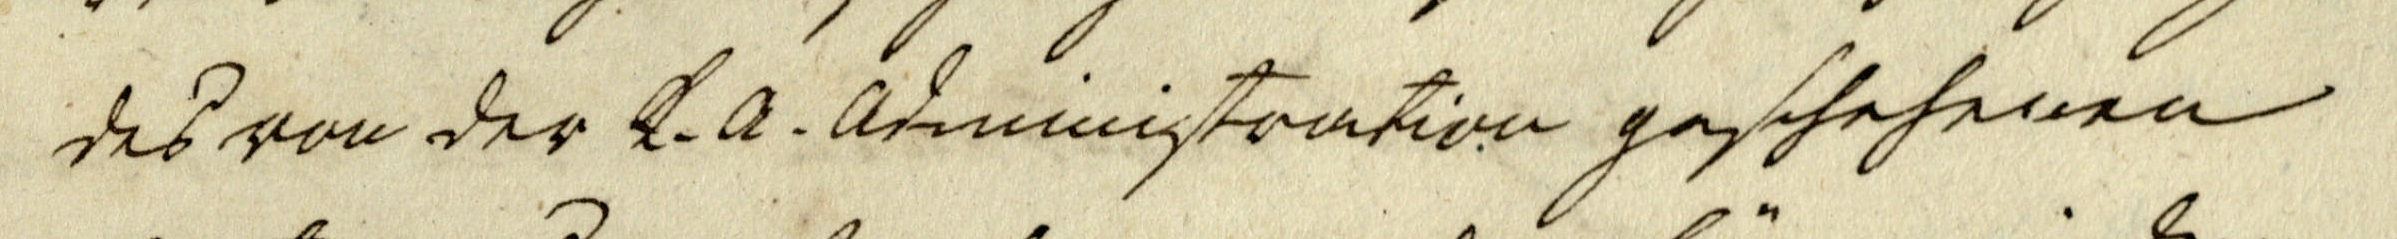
des von der K A. Administration geschehenen
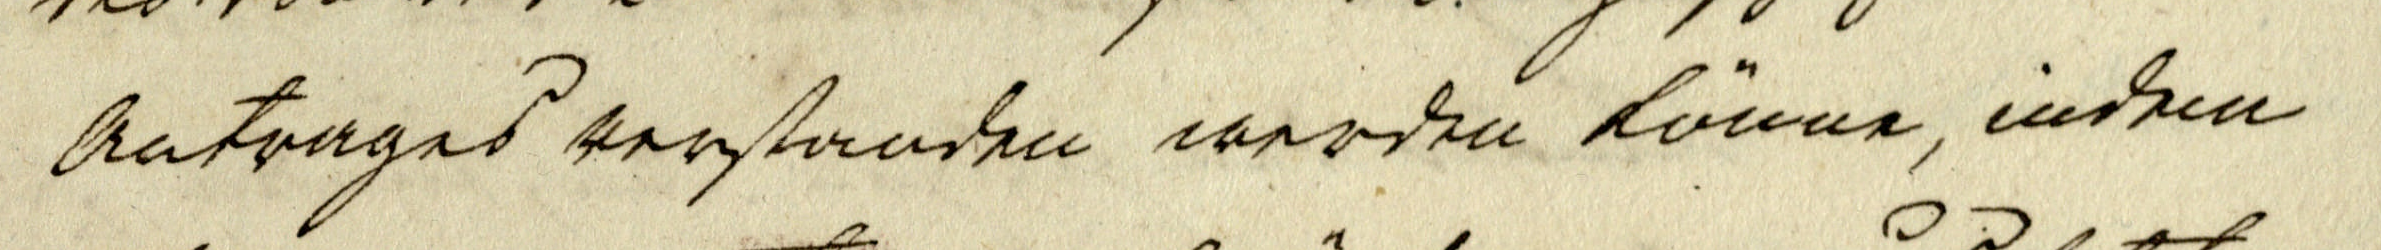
Antrages verstanden werden könne, indem
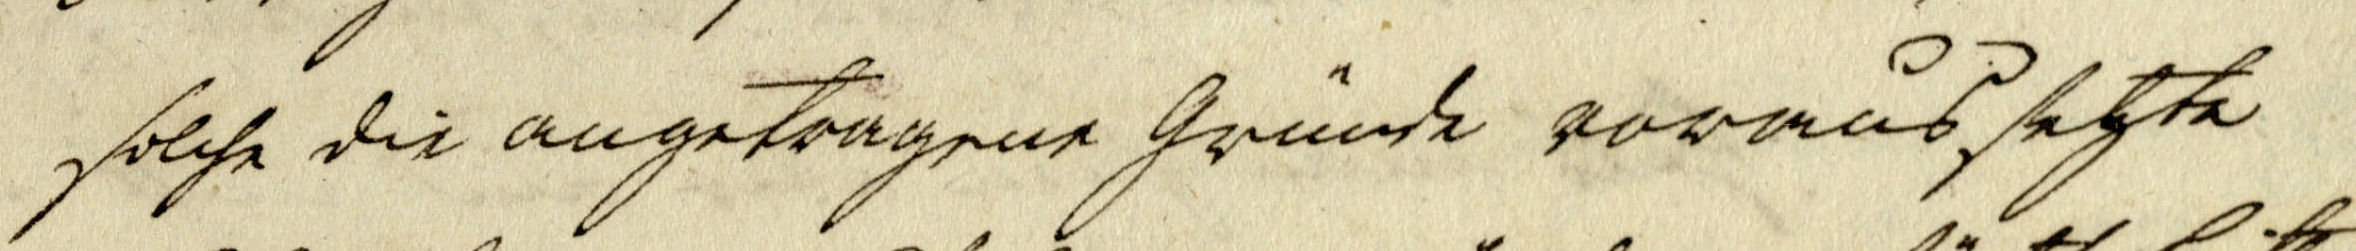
solche die angetragene Gründe voraussetzte
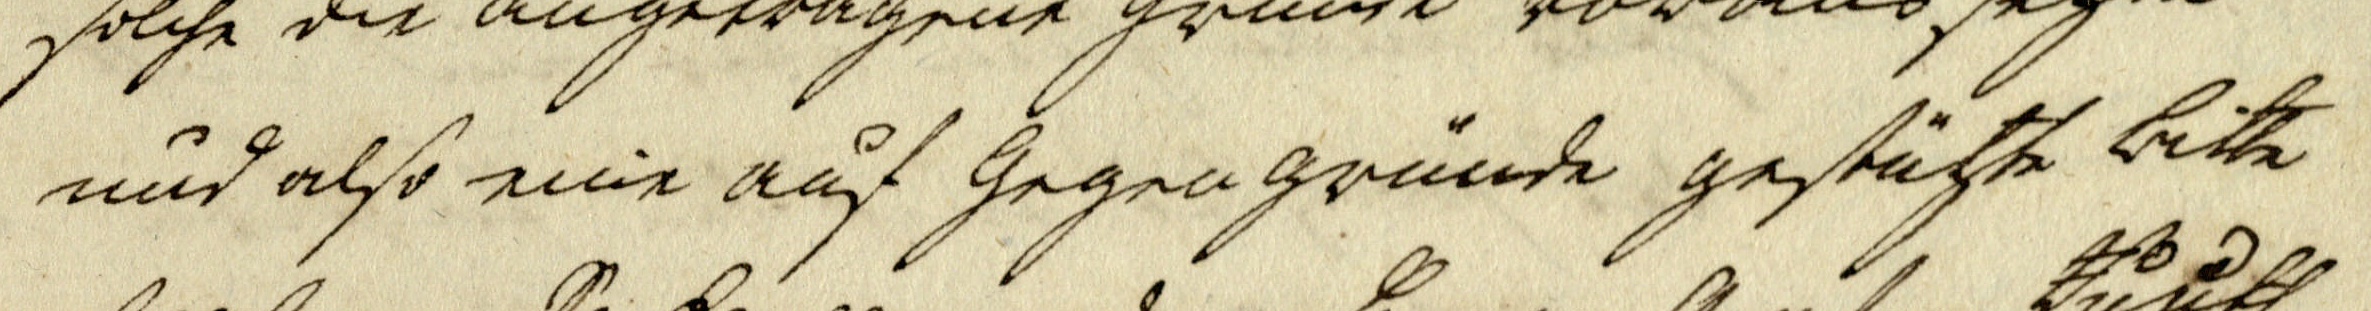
und also eine auf Gegengründe gestützte Bitte
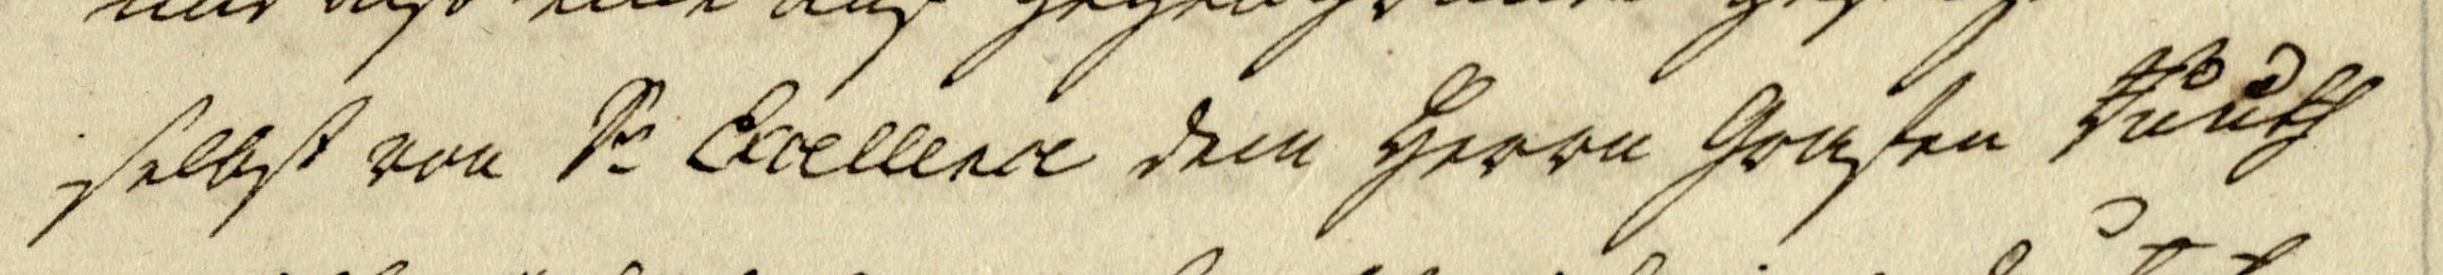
selbst von Sr. Excellence dem Herrn Grafen Ruuth
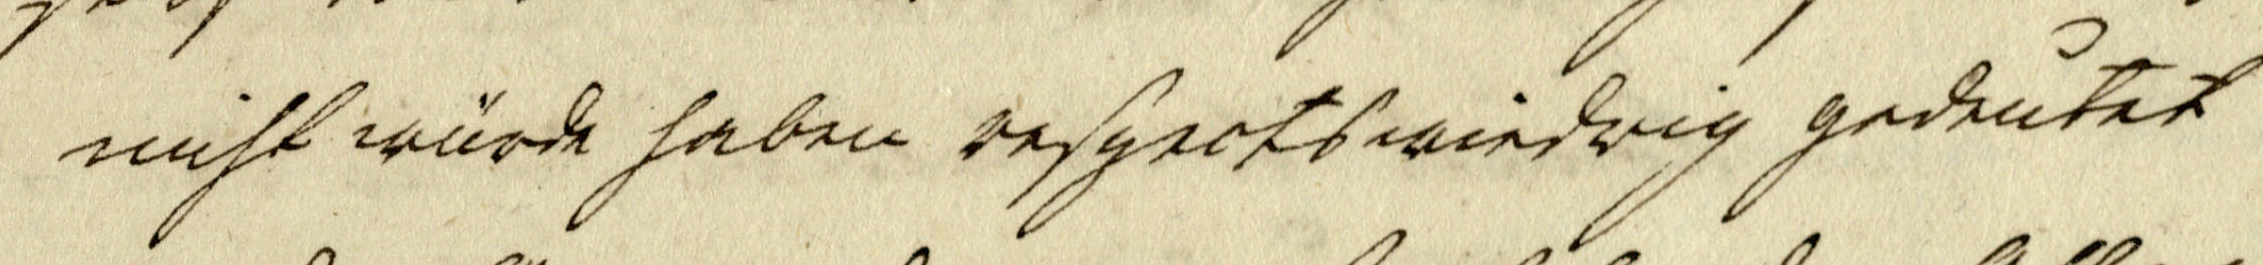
nicht würde haben respectswiedrig gedeutet
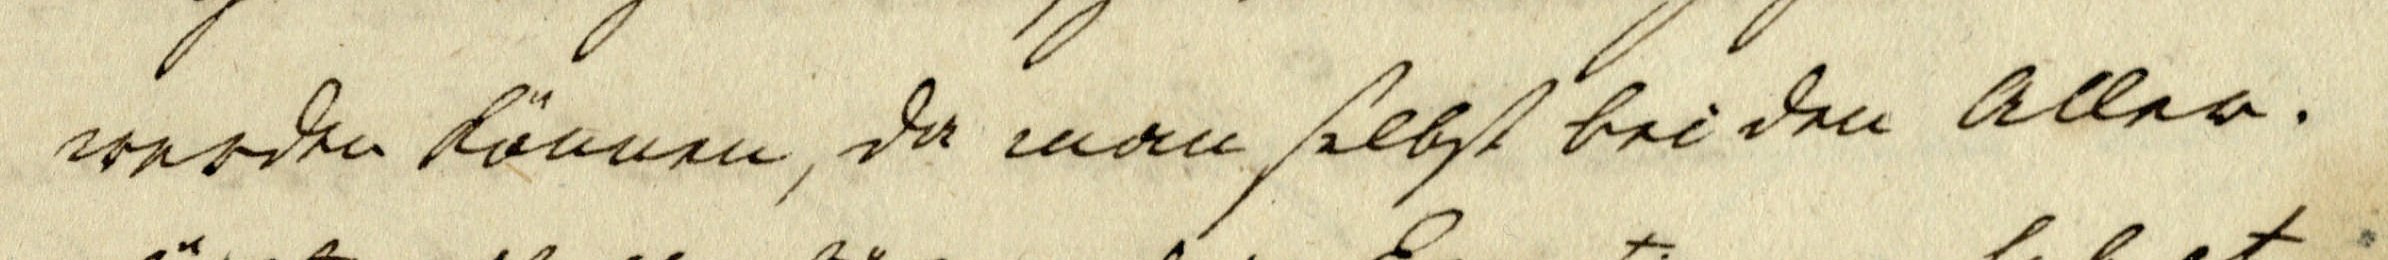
werden können, da man selbst bei den Aller¬
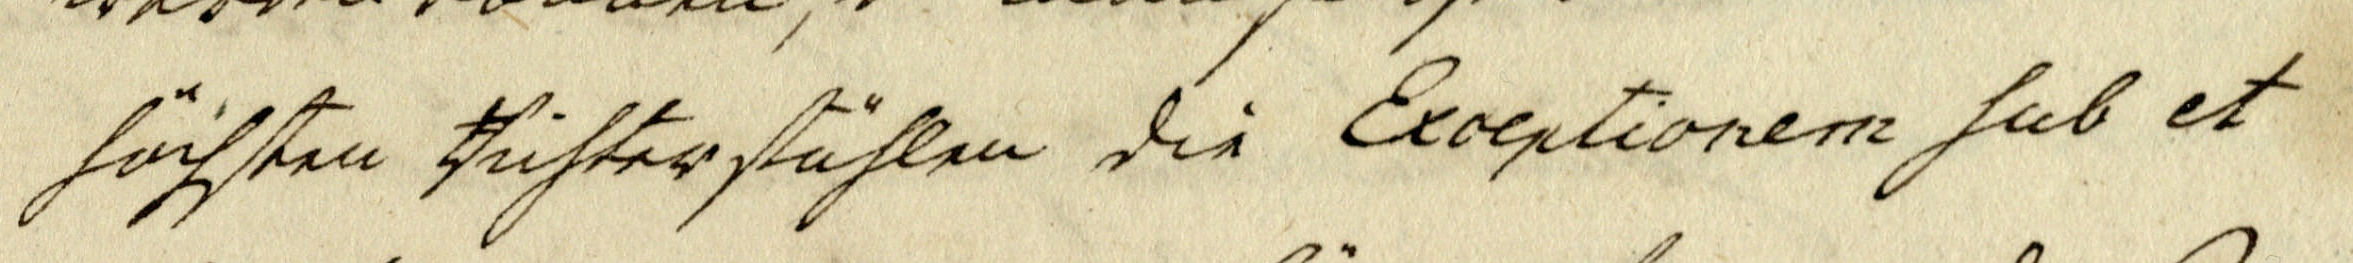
höchsten Richterstühlen die Exceptionem sub et
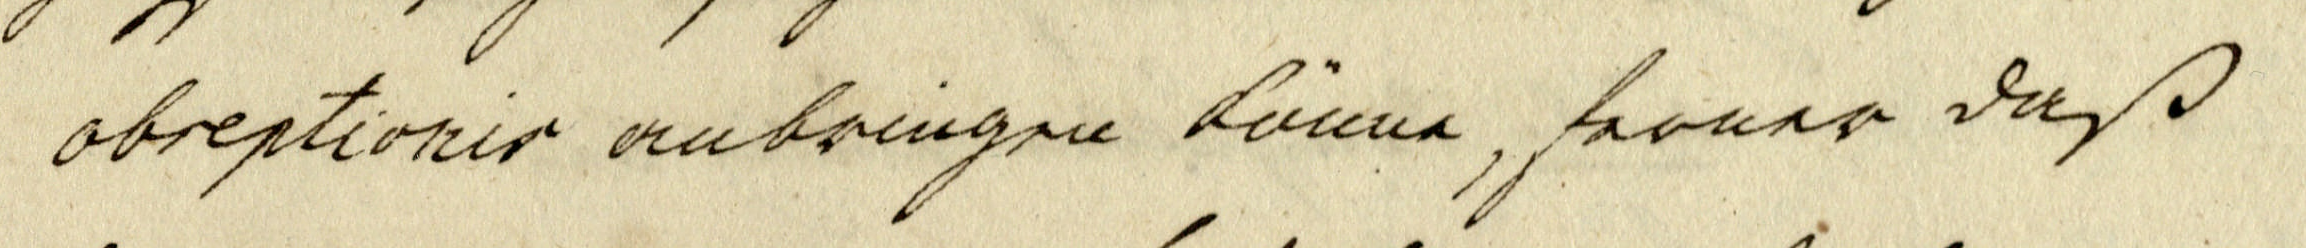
obreptionis anbringen könne, ferner daß
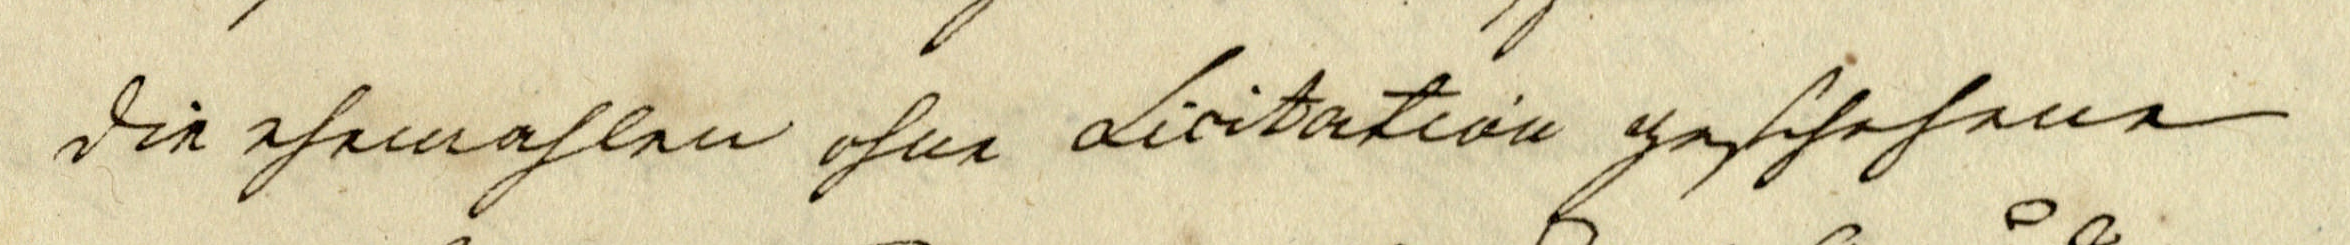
die ehemahlen ohne Licitation geschehene
